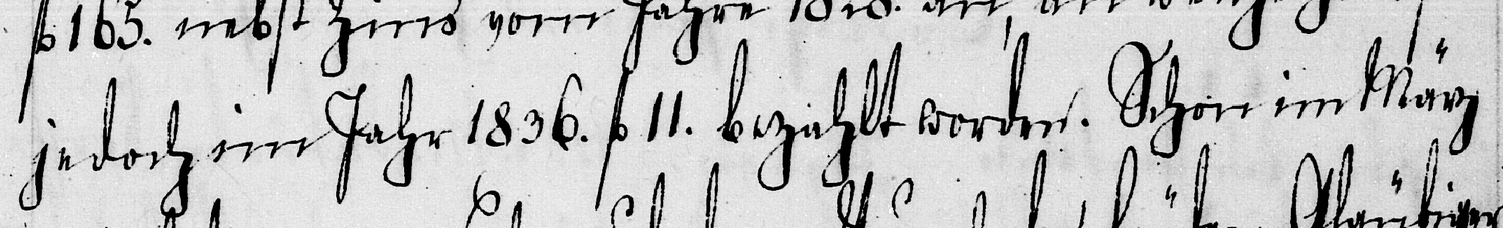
jedoch im Jahr 1836. fl. 11. bezahlt worden. Schon im März
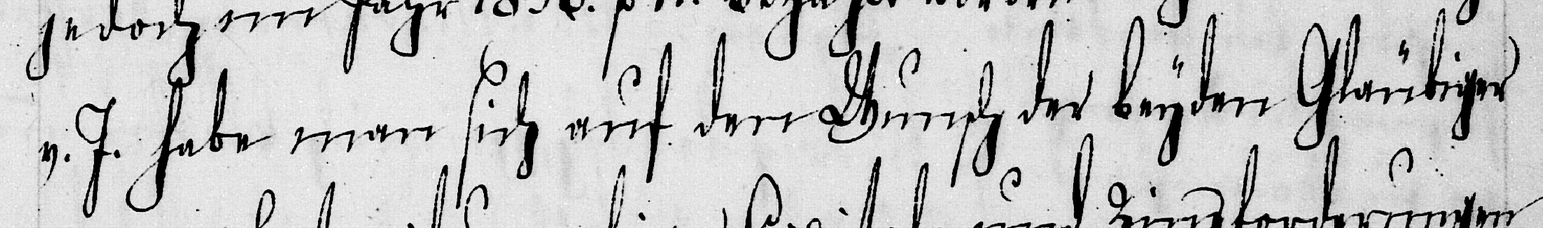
J. habe man sich auf den Wunsch der beyden Gläubiger
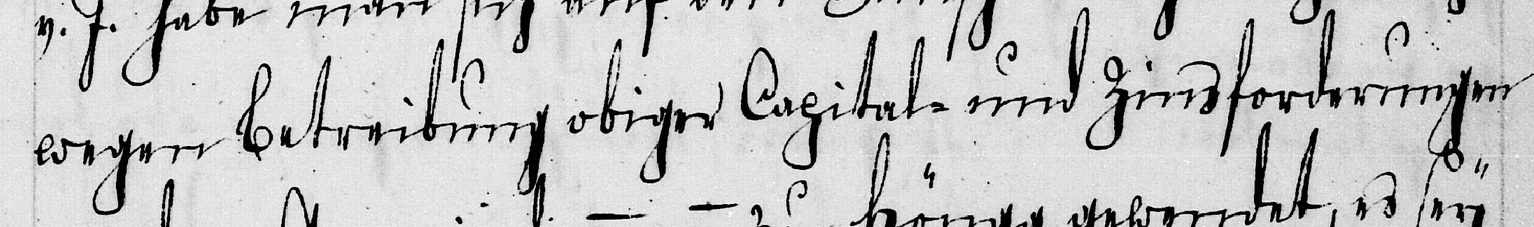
wegen Betreibung obiger Capital- und Zinsforderungen
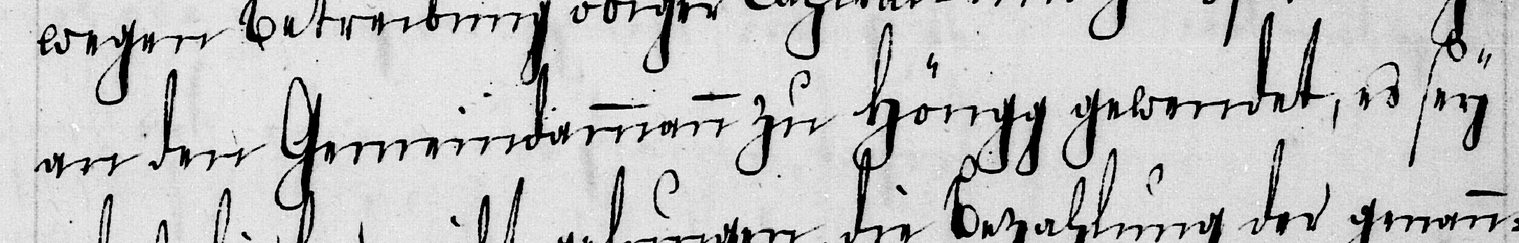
an den Gemeindeammann zu Höngg gewendet, es sey
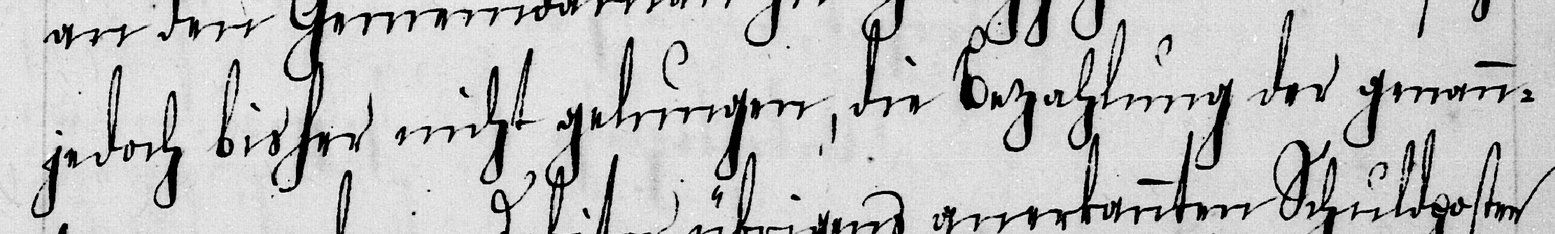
jedoch bisher nicht gelungen, die Bezahlung der genann¬
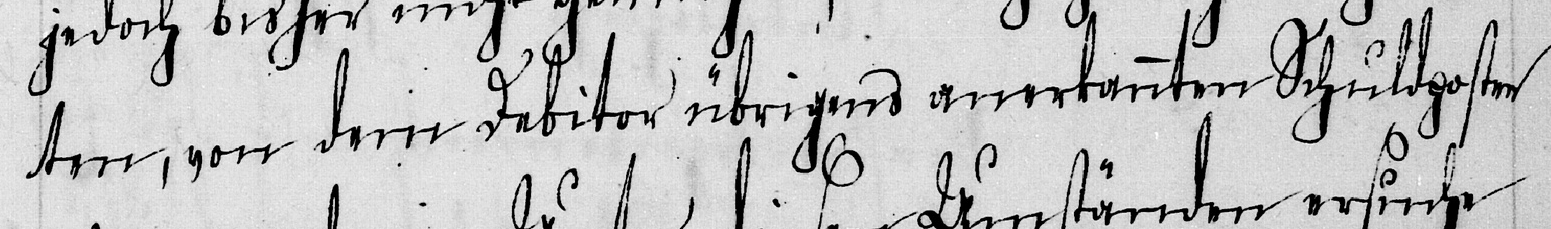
ten, von dem Debitor übrigens anerkannten Schuldposten
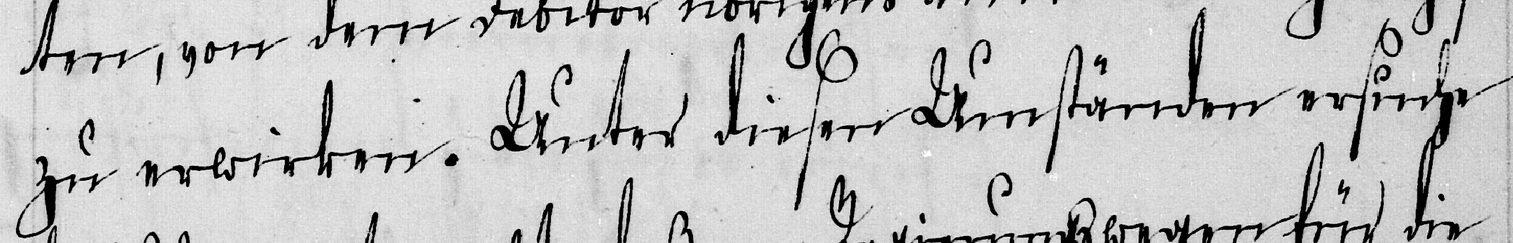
zu erwirken. Unter diesen Umständen ersuche
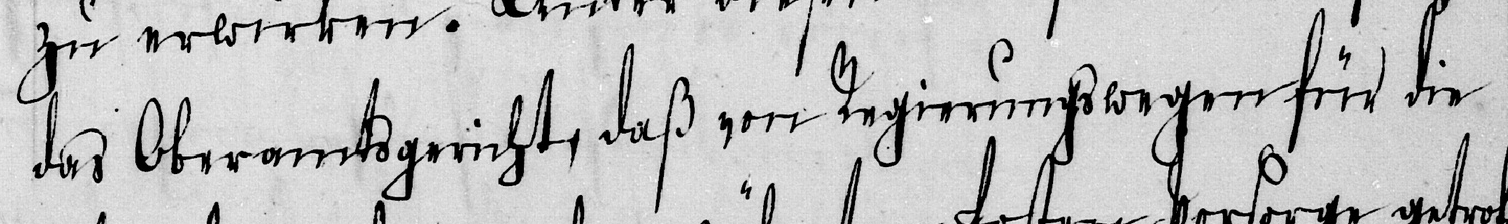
das Oberamtsgericht, daß von Regierungs wegen für die
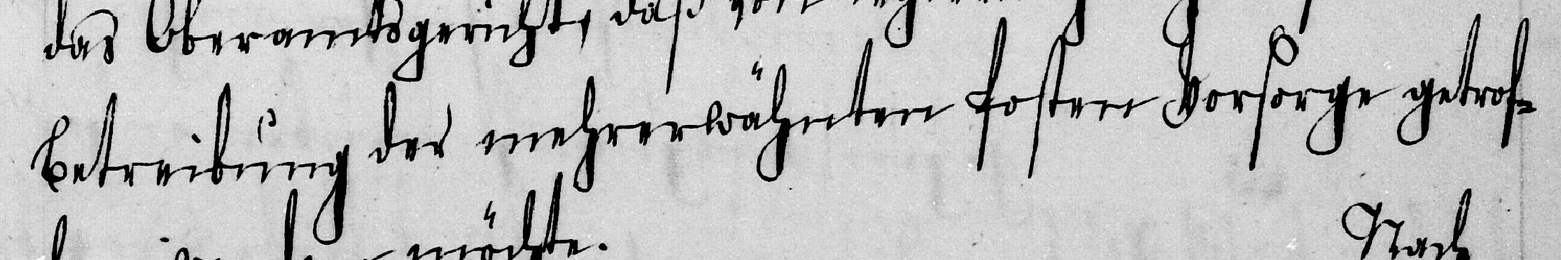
Betreibung der mehrerwähnten Posten Vorsorge getrof¬
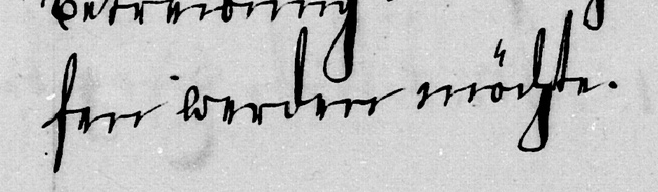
fen werden möchte.
